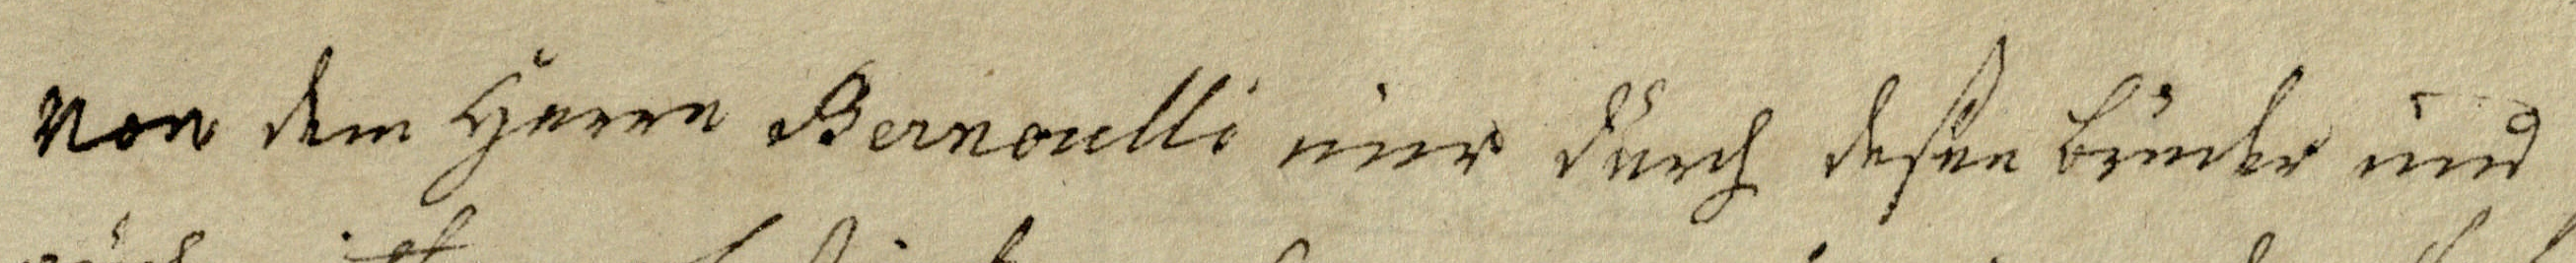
von dem Herrn Bernoulli nur durch deßen Bruder und
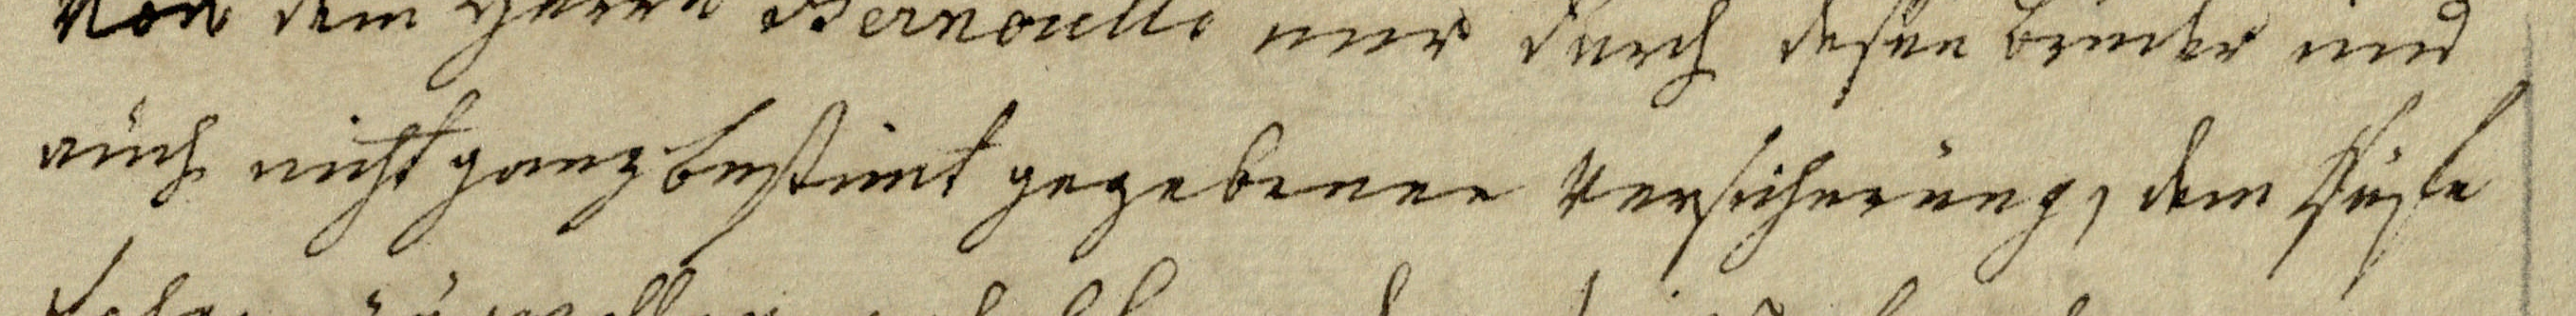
auch nicht ganz bestimt gegebenen Versicherung, dem Rufe
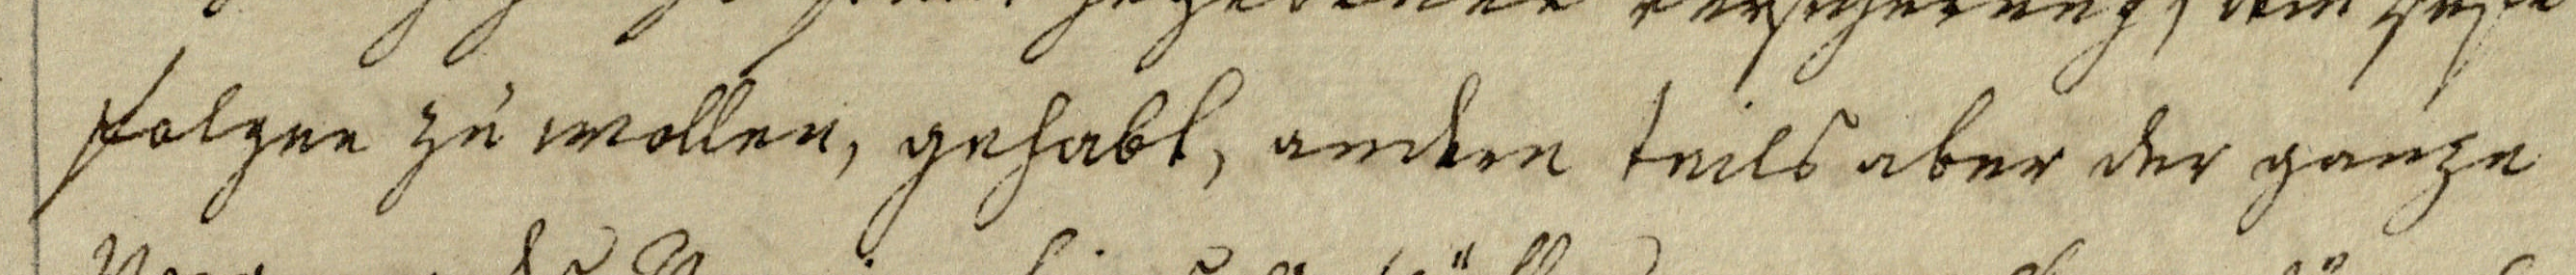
folgen zu wollen, gehabt, andern teils aber der ganze
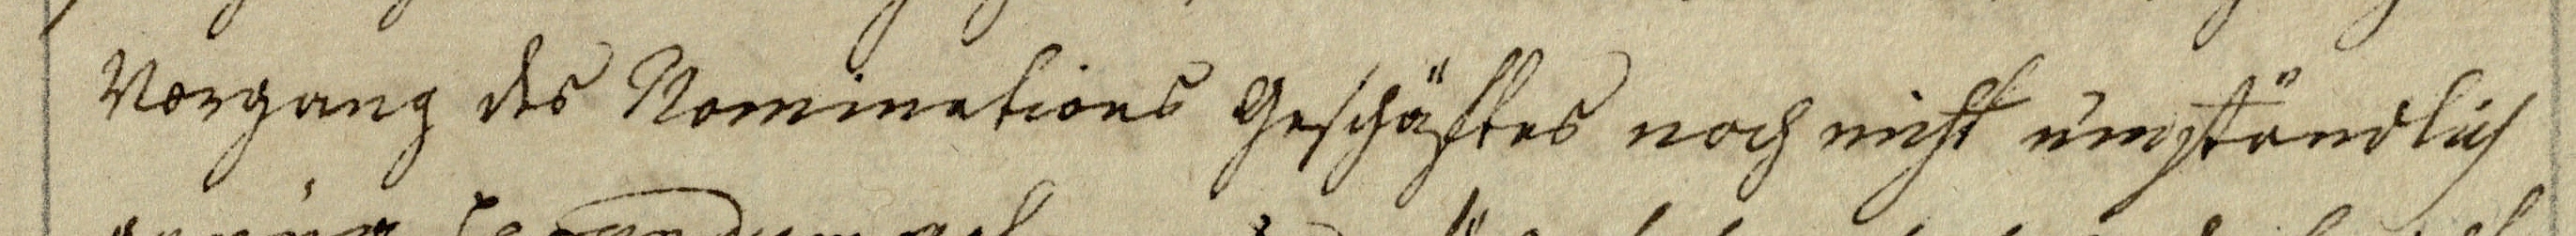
Vorgang des Nominations Geschäftes noch nicht umständlich
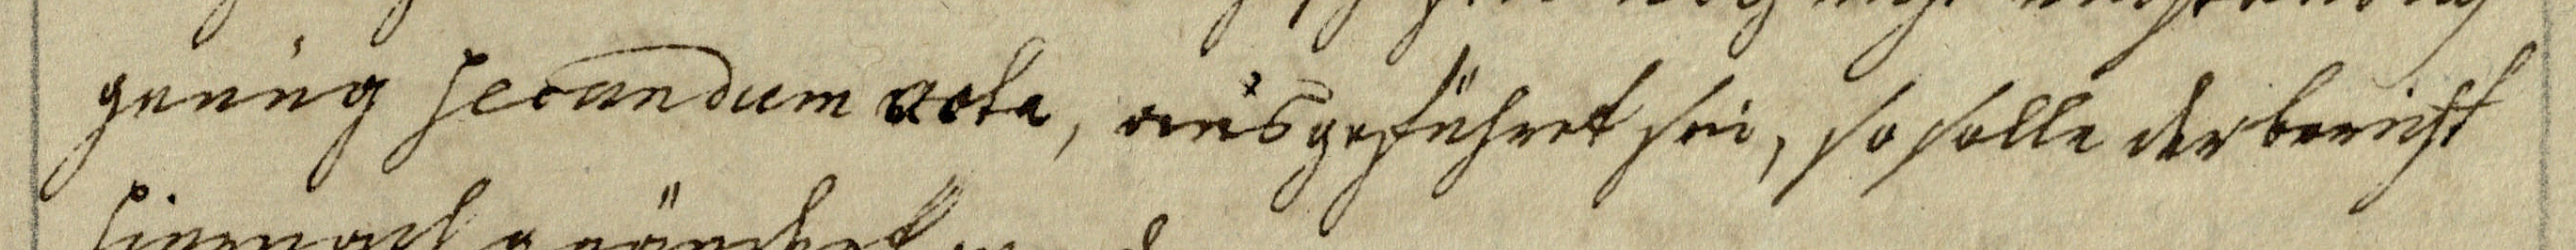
genug secundum Acta, ausgeführet sei, so solle der Bericht
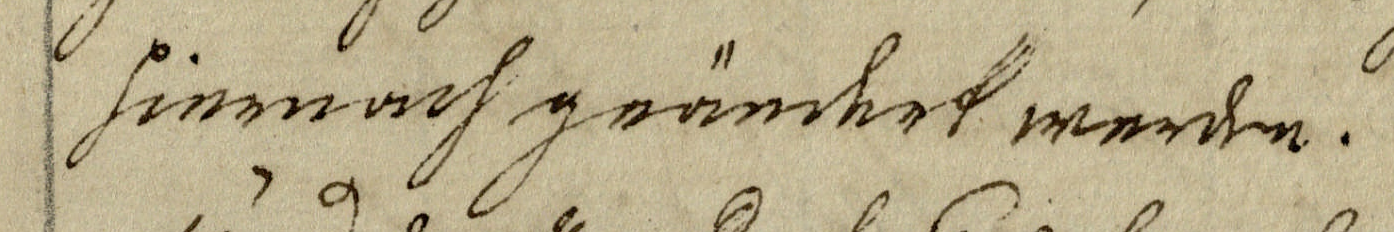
hiernach geändert werden.
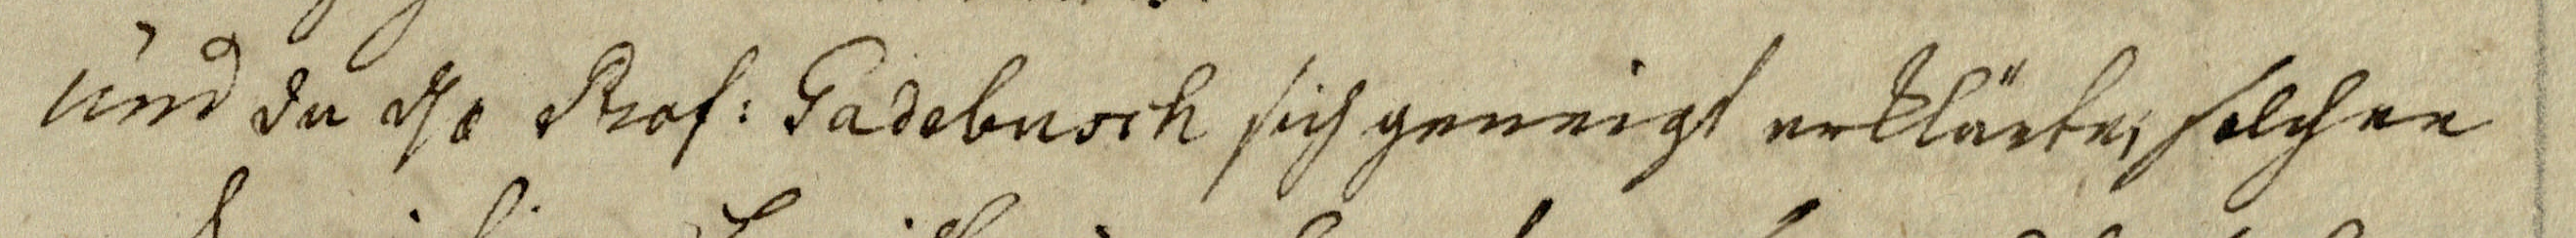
Und da dh. Prof. Gadebusch sich geneigt erklärte, solchen
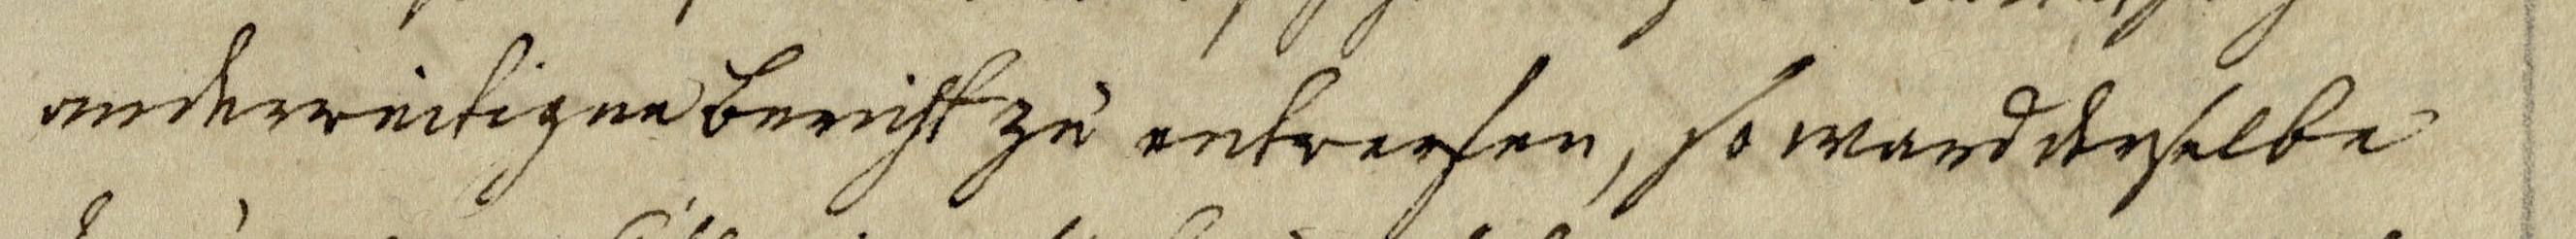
anderweitigen Bericht zu entwerfen, so ward derselbe
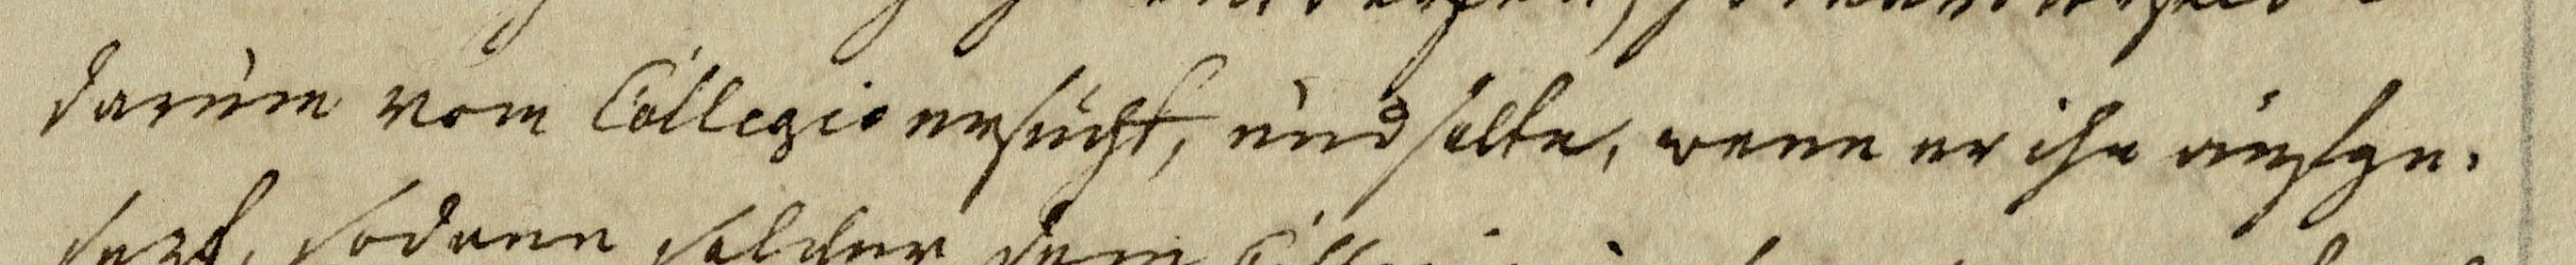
darum vom Collegio ersucht, und solte, wenn er ihn auf¬
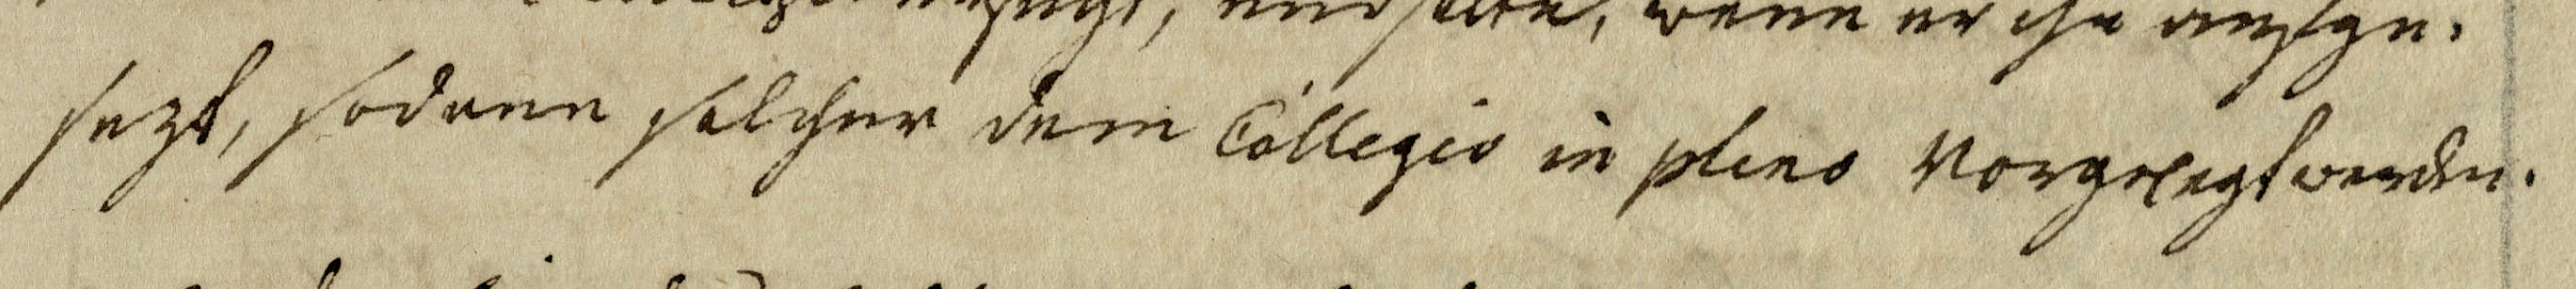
sezt, sodann solcher dem Collegio in pleno vorgelegt werden.
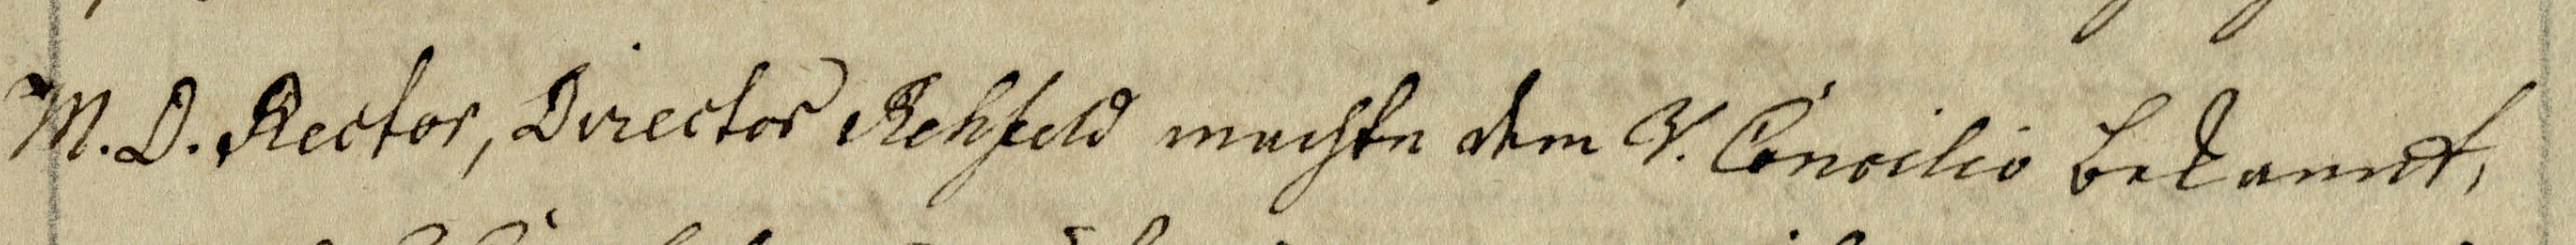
M. D. Rector, Director Rehfeld machte dem V. Concilio bekannt,
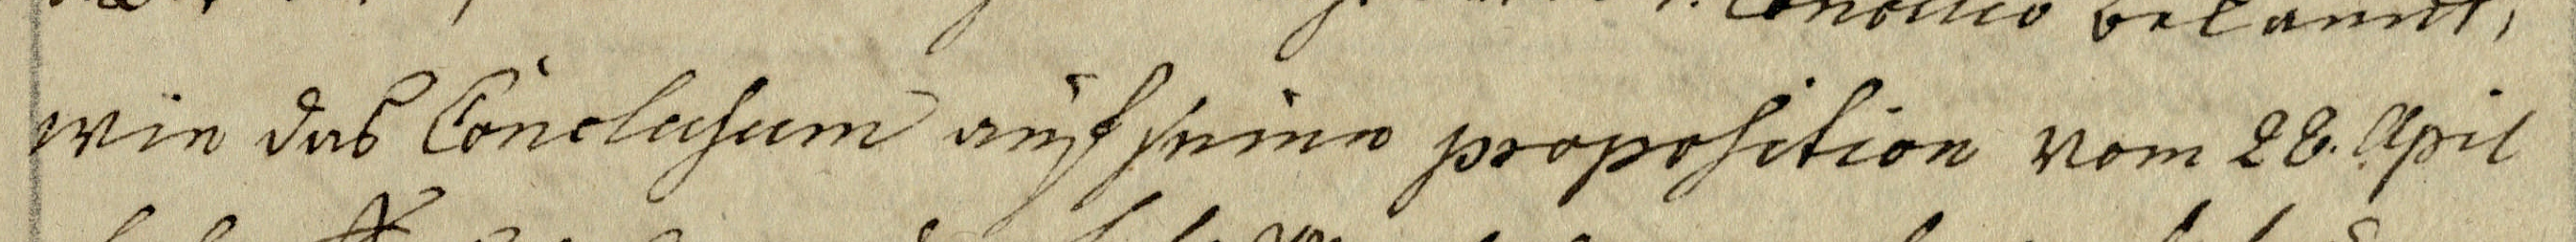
wie das Conclusum auf seine proposition vom 28. Apil
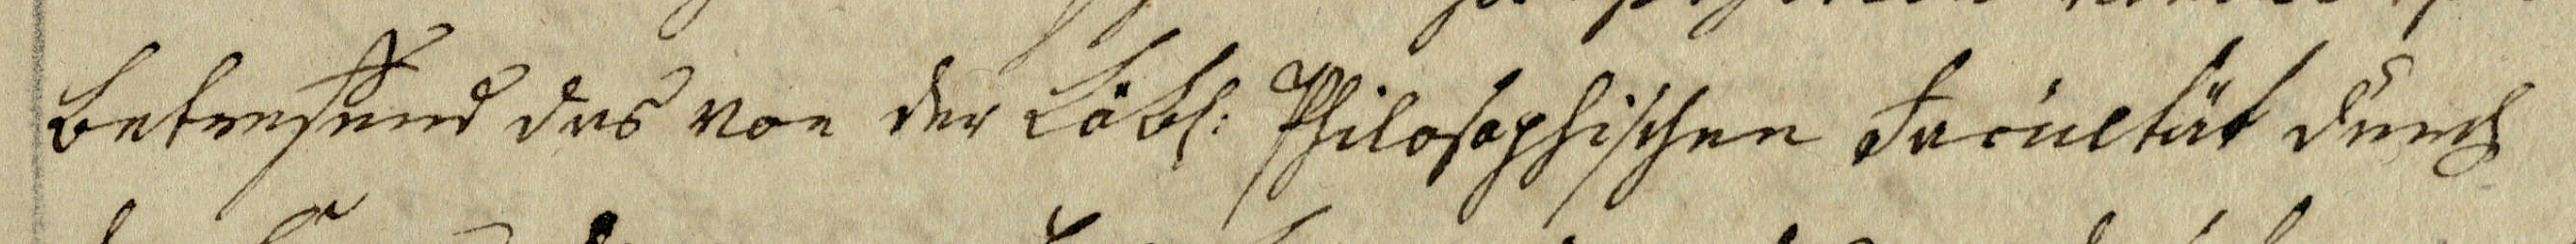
betreffend das von der Löbl. Philosophischen Facultät durch
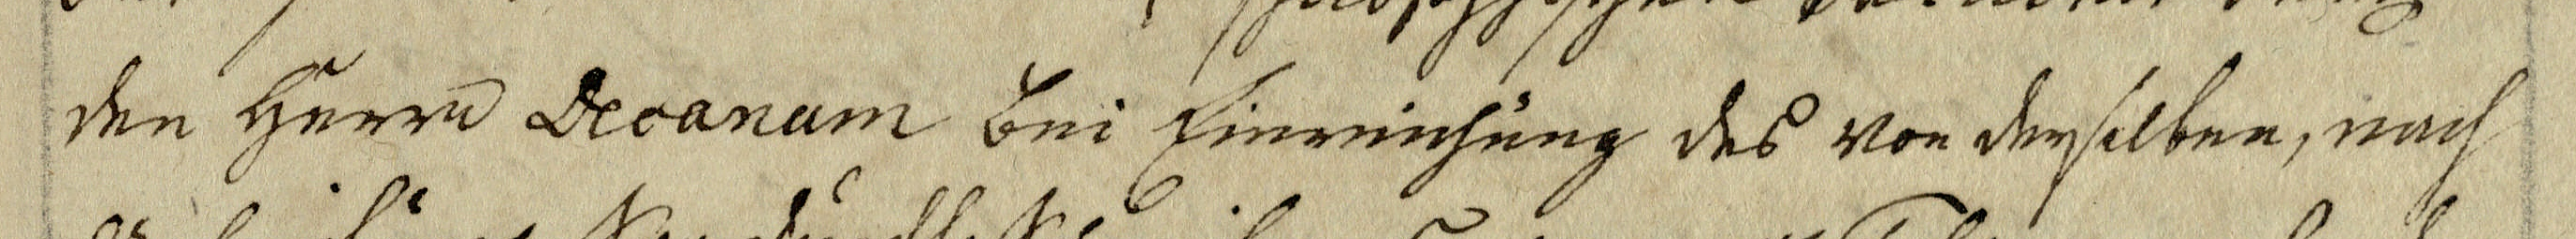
den Herrn Decanum bei Einreichung des von derselben, nach
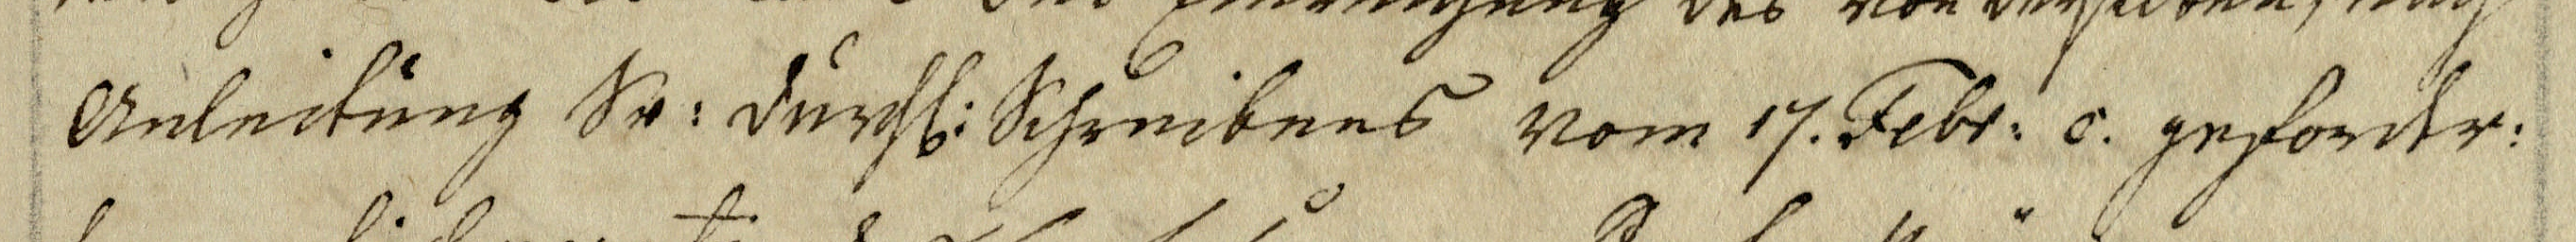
Anleitung Sr Durchl. Schreibens vom 17. Febr. c. geforder¬
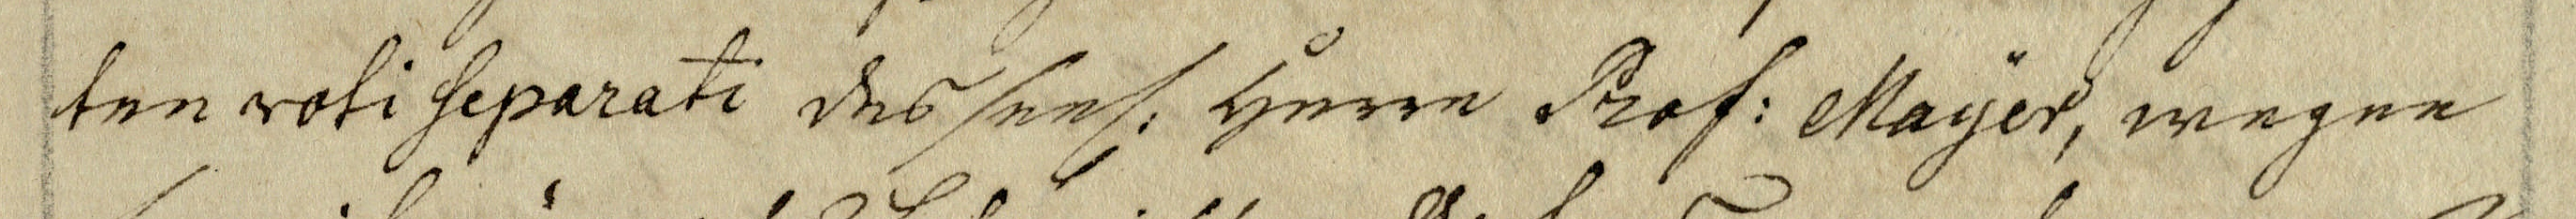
ten voti separati des seel. Herrn Prof. Maÿer, wegen
